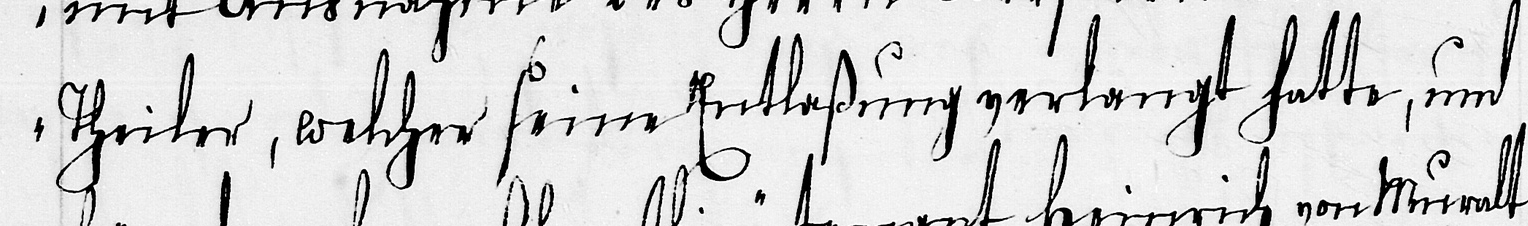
Theiler, welcher seine Entlaßung verlangt hatte, und
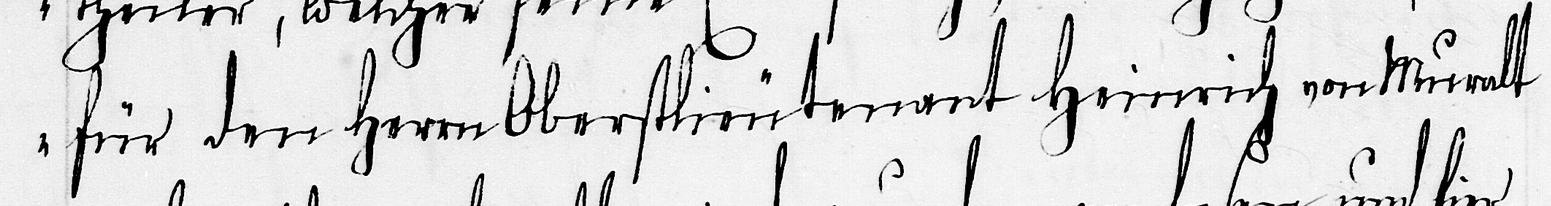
für den Herrn Oberstlieutenant Heinrich von Muralt
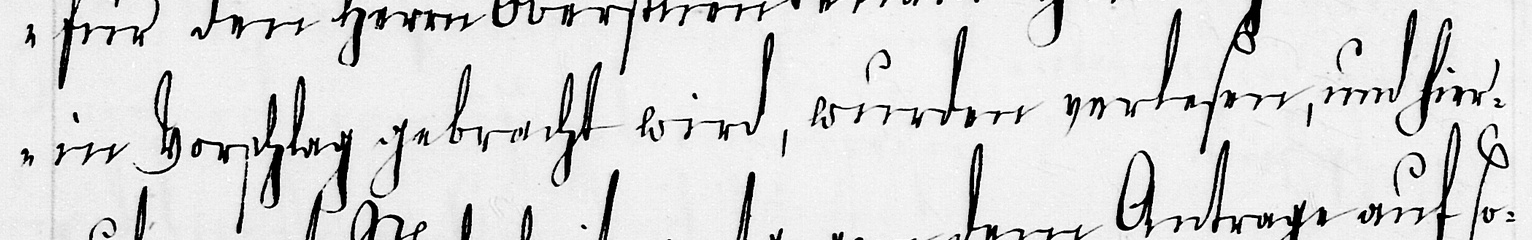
in Vorschlag gebracht wird, wurden verlesen, und hie¬
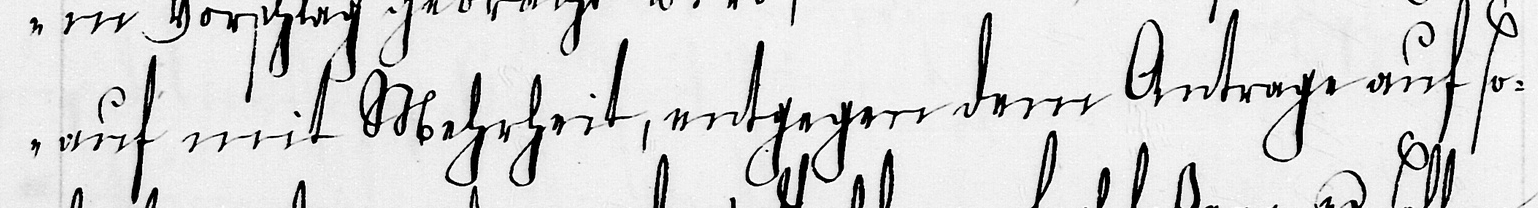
rauf mit Mehrheit, entgegen dem Antrage auf so¬
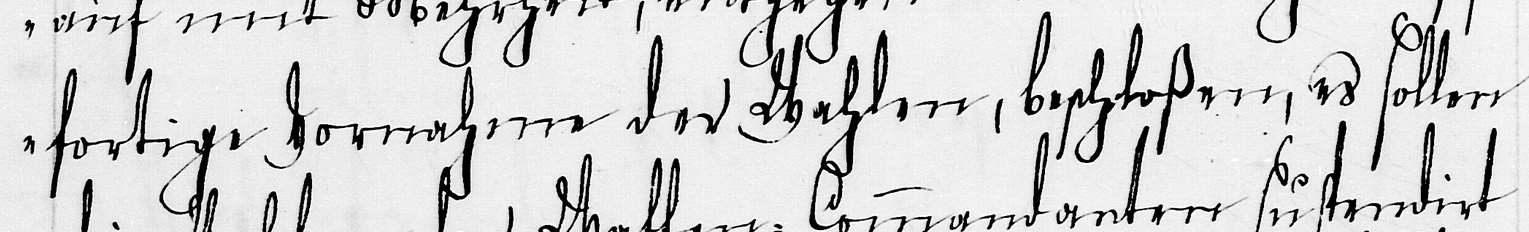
fortige Vornahme der Wahlen, beschloßen, es sollen
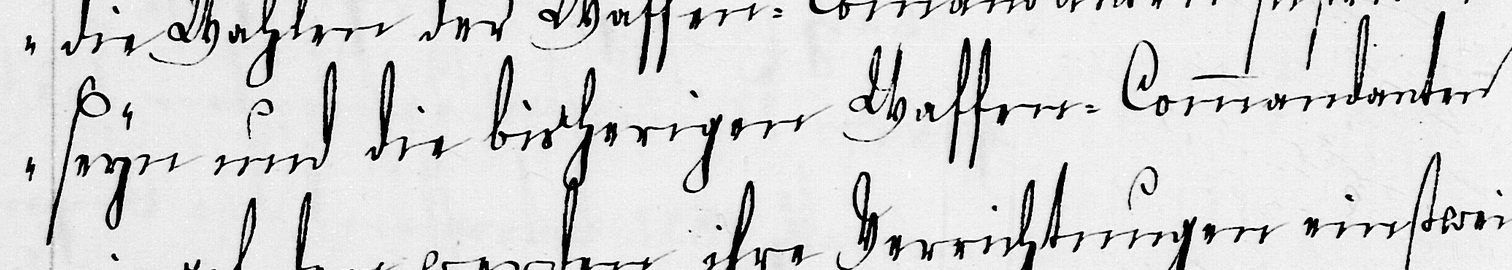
seyn und die bisherigen Waffen-Commandanten
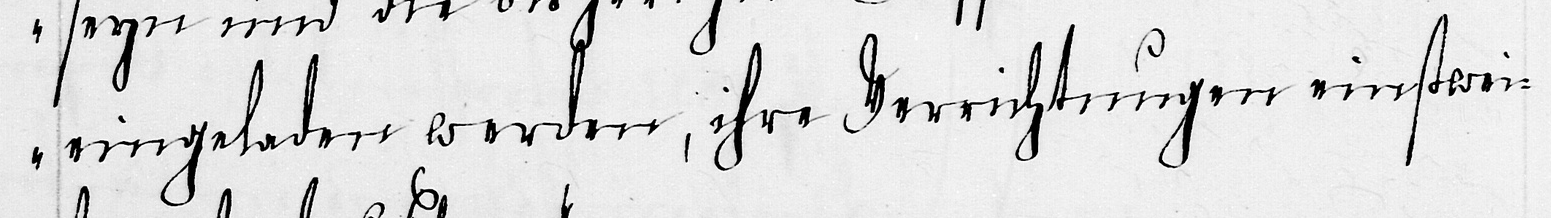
eingeladen werden, ihre Verrichtungen einstwei¬
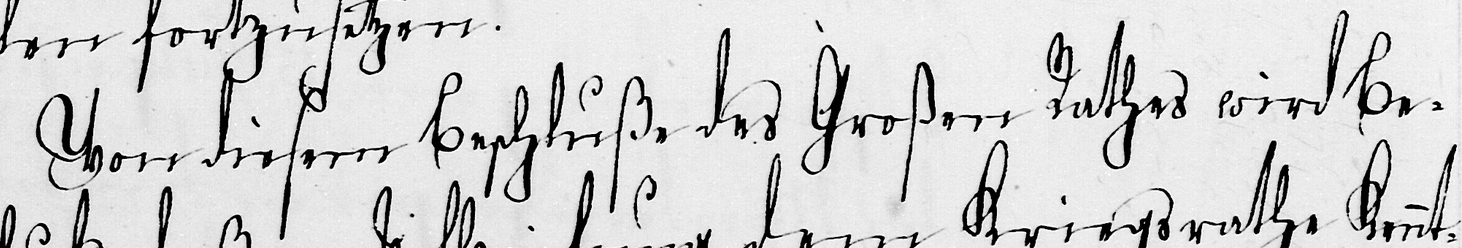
Von diesem Beschluße des Großen Rathes wird Be¬
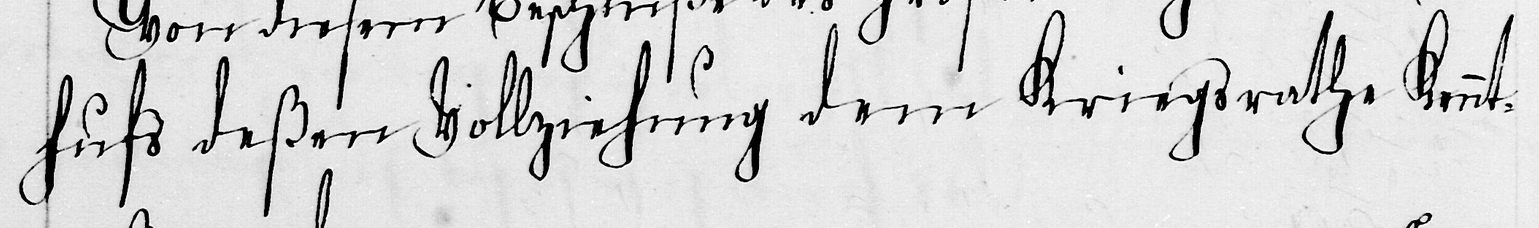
hufs deßen Vollziehung dem Kriegsrathe Ken¬
